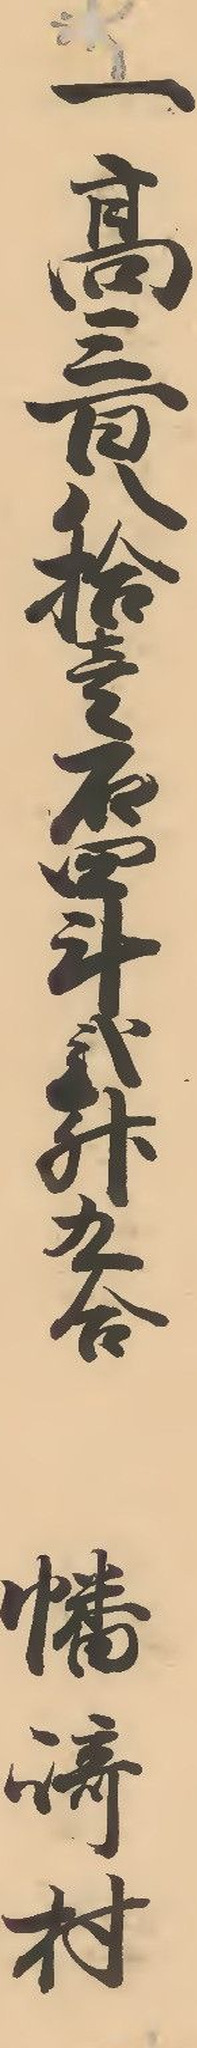一髙三百八拾壱石四斗弐升九合幡崎村
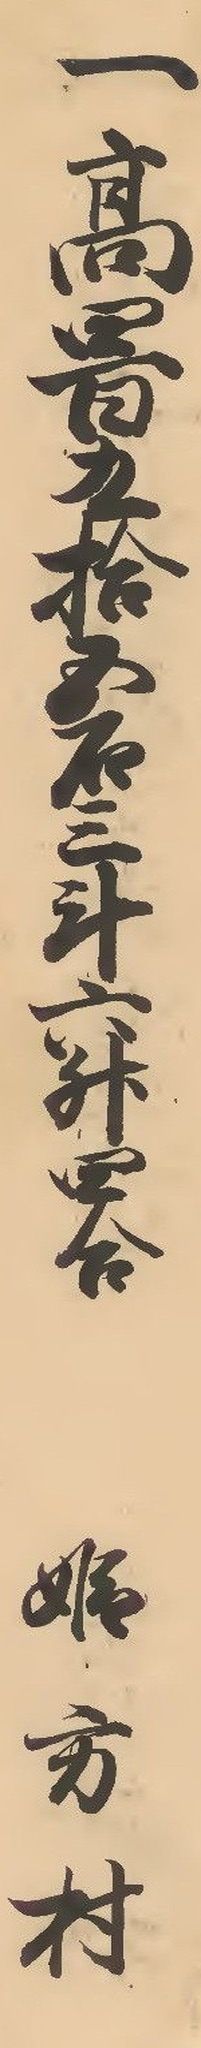一髙四百九拾五石三斗六升四合姫方村

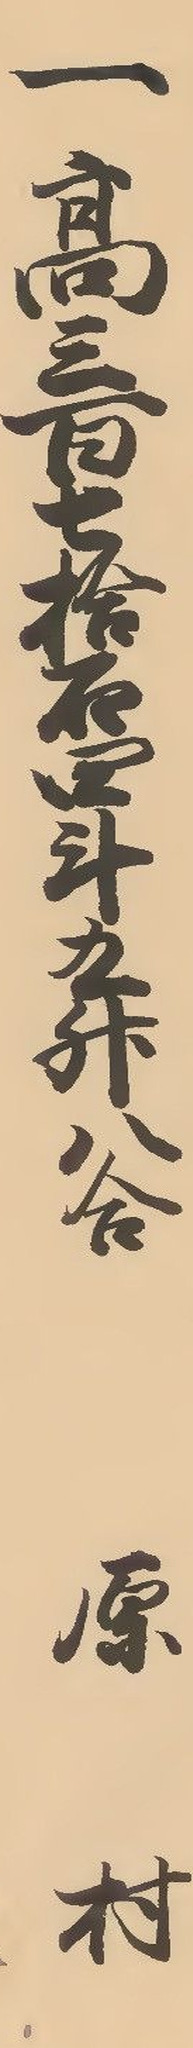一髙三百七拾石四斗九升八合原村
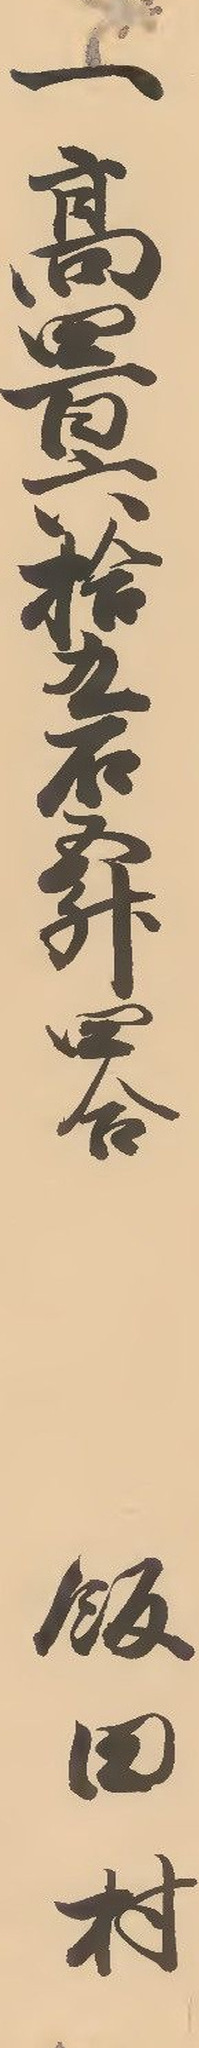一髙四百六拾九石五升四合飯田村
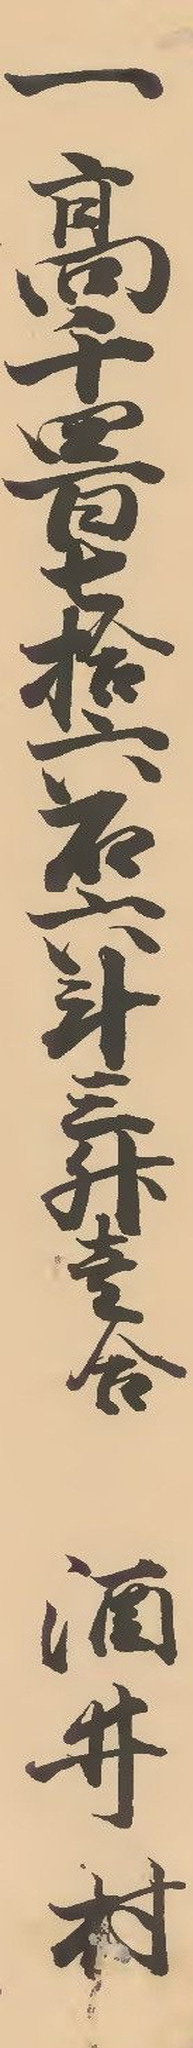一髙千四百七拾六石六斗三升壱合酒井村
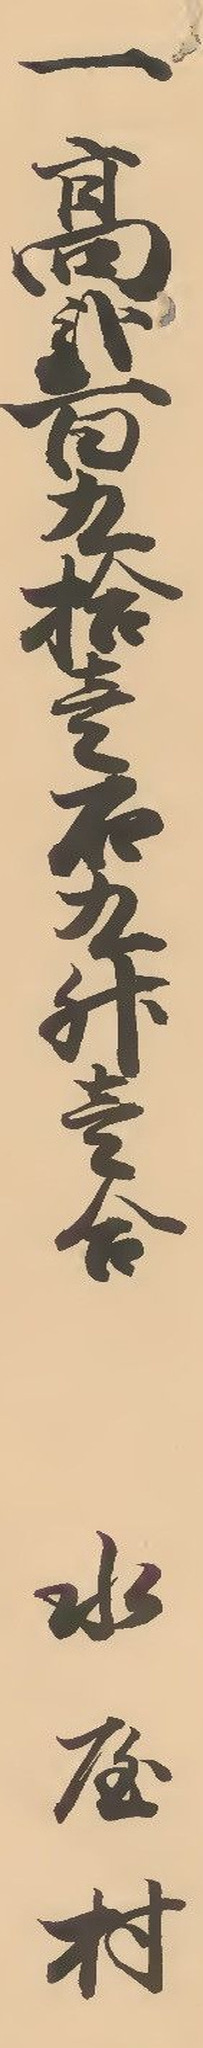一髙弐百九拾壱石九升壱合水屋村
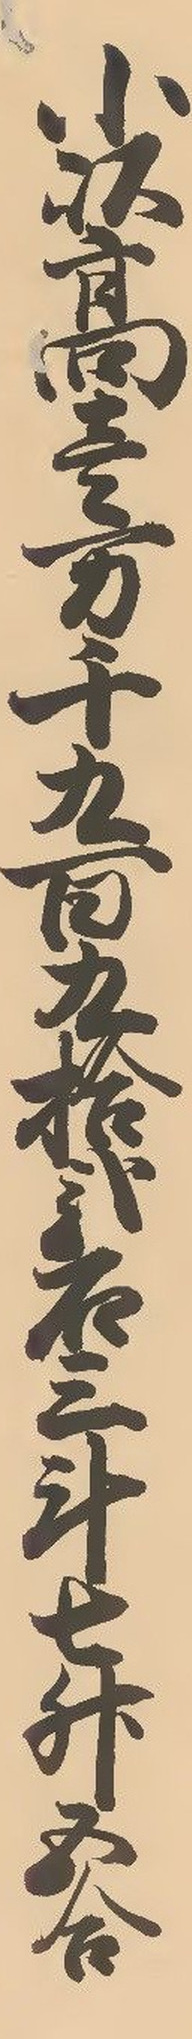小以髙壱万千九百九拾弐石三斗七升五合

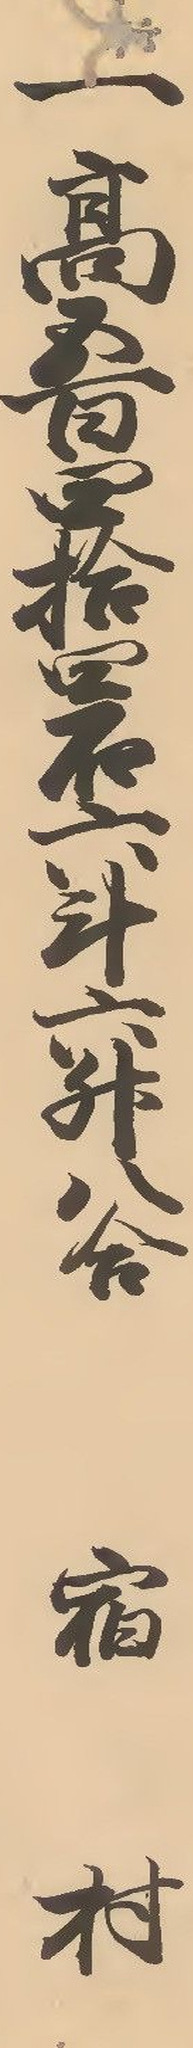一髙五百四拾四石六斗六升八合宿村
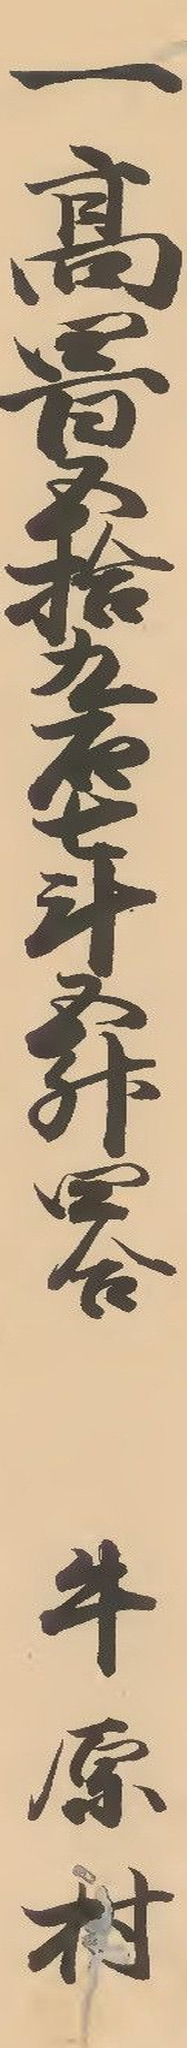一髙四百五拾九石七斗五升四合牛原村
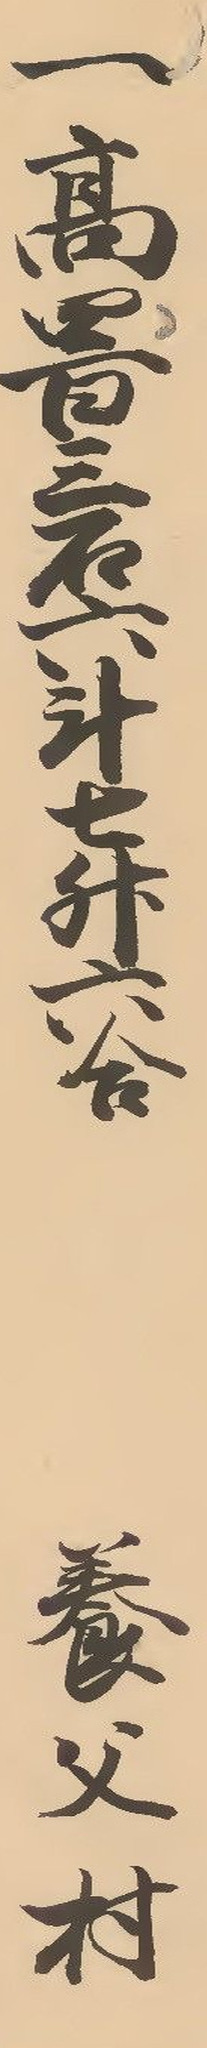一髙四百三石六斗七升六合養父村
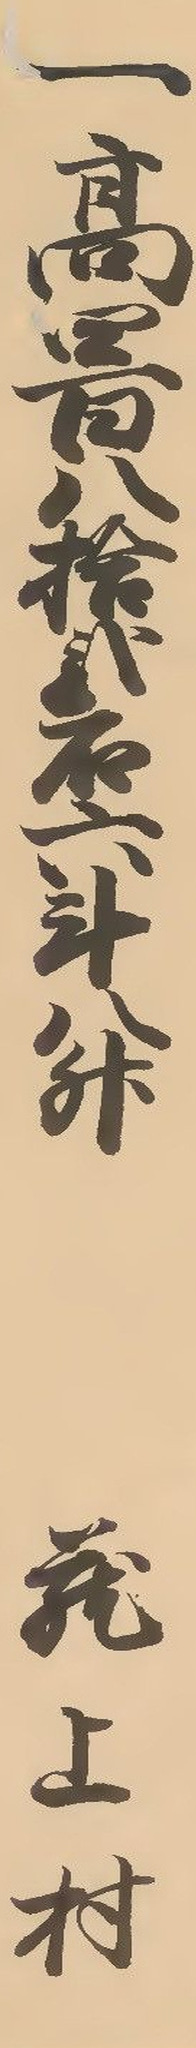一髙四百八拾弐石六斗八升藏上村
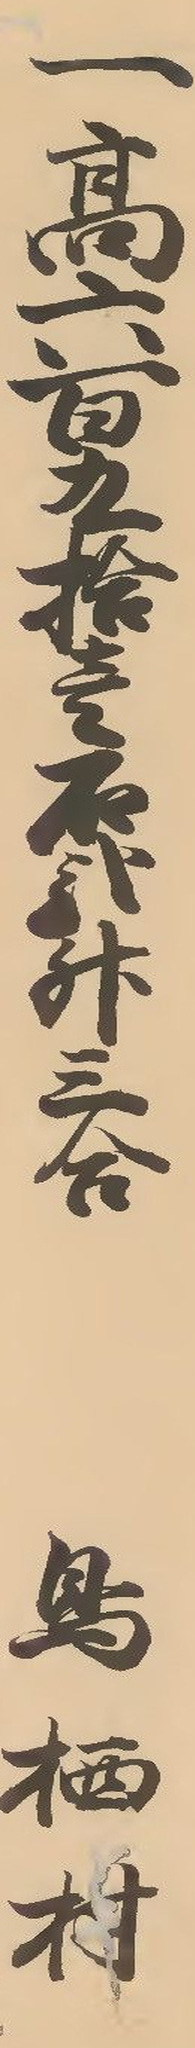一髙六百九拾壱石弐升三合鳥栖村
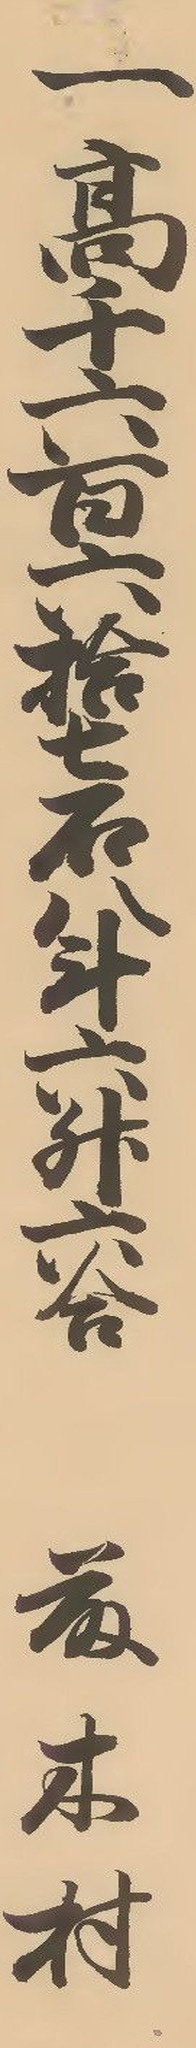一髙千六百六拾七石八斗六升六合藤木村
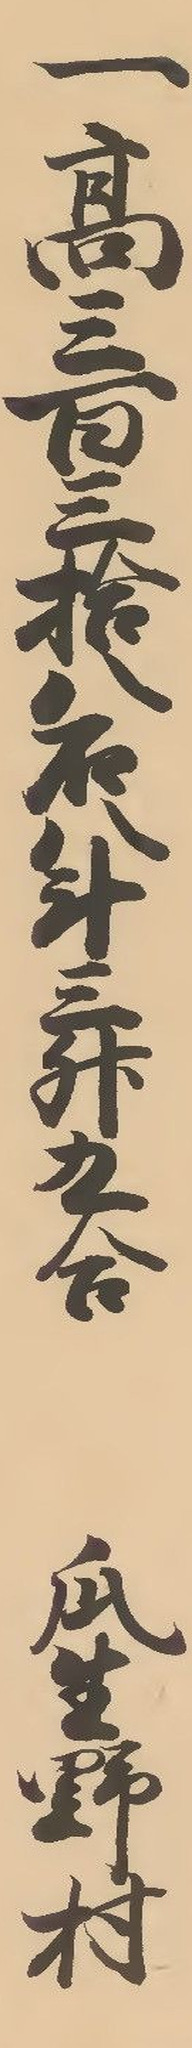一髙三百三拾八石八斗三升九合瓜生野村

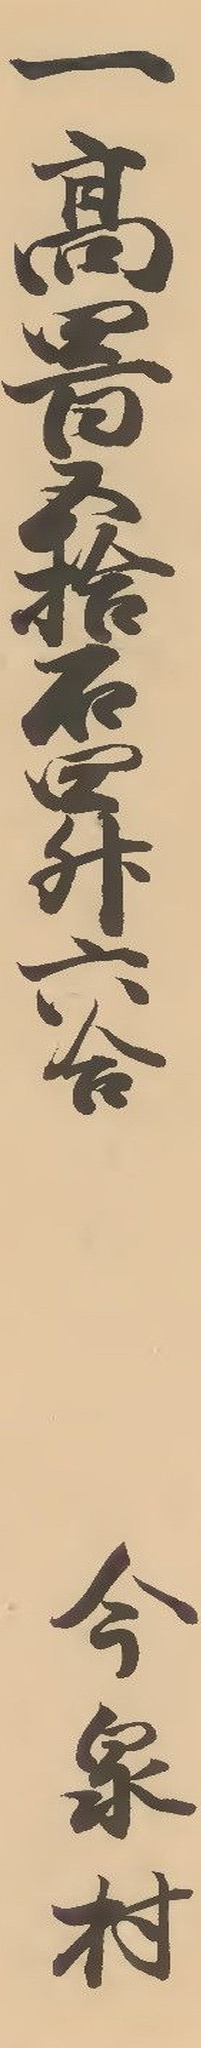一髙四百五拾石四升六合今泉村
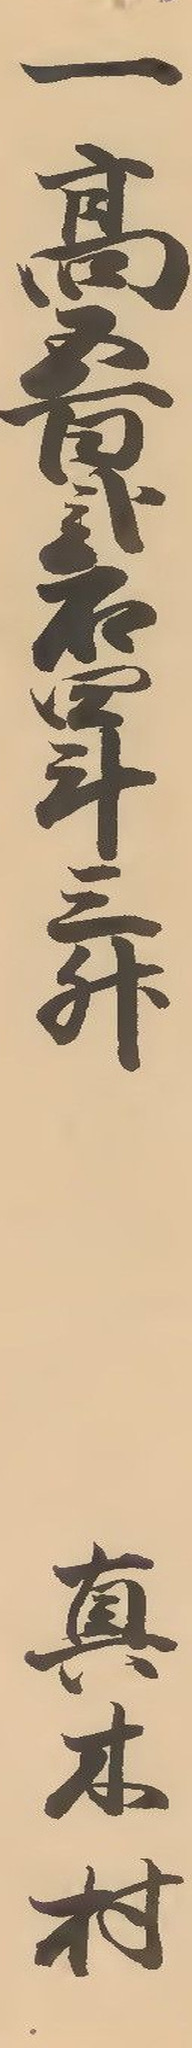一髙五百弐石四斗三升真木村
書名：肥前国郷帳
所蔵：国立公文書館 National Archives of Japan
